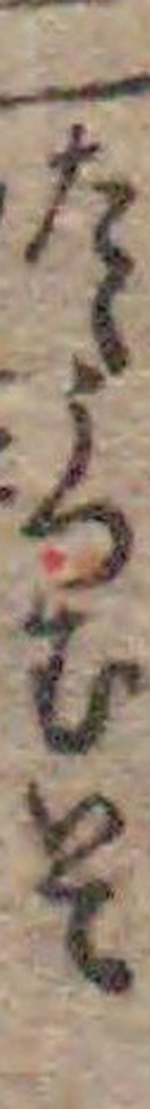たゝうつむいて

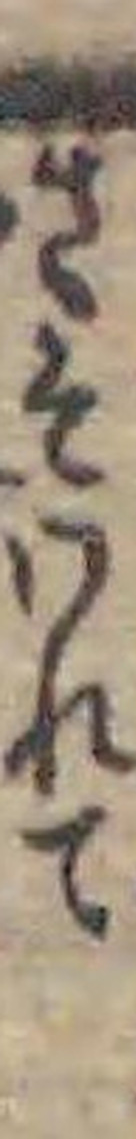さそはれて
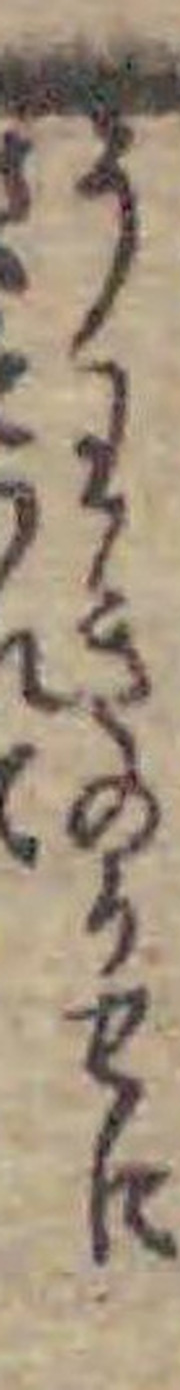うはきのかせに
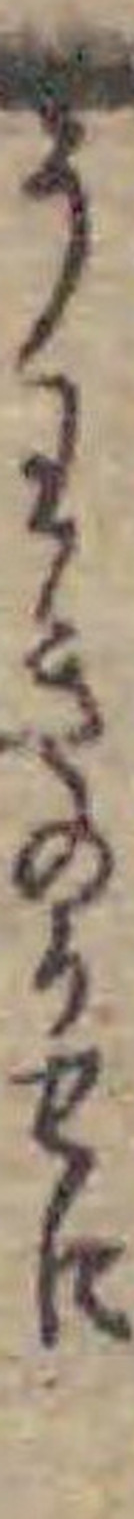うはきのかせに
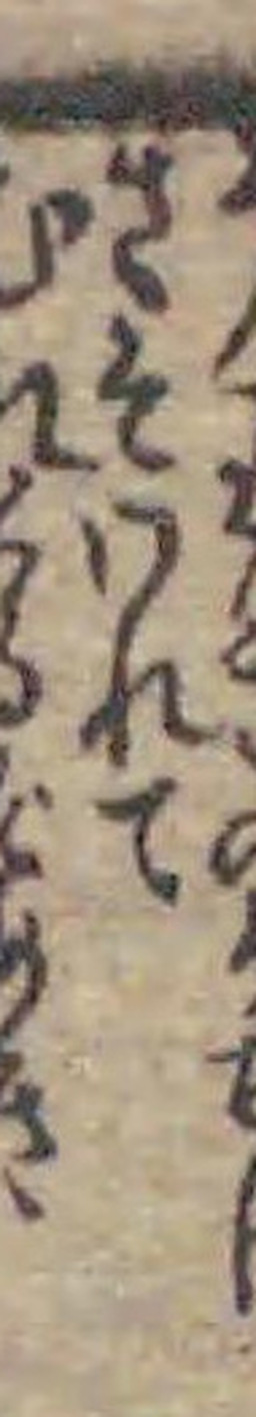むれくるそめき
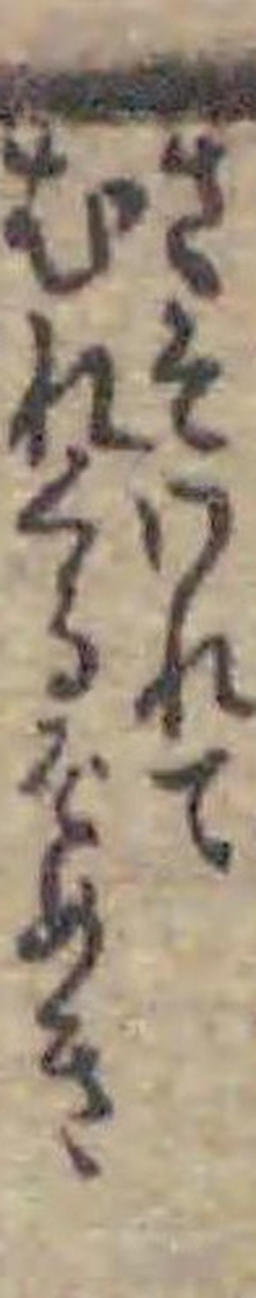むれくるそめき
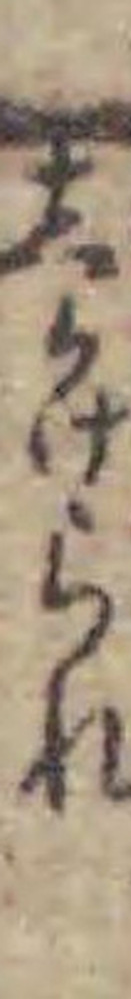しかけられ
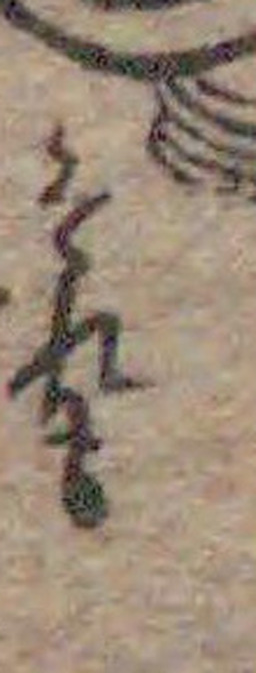それも
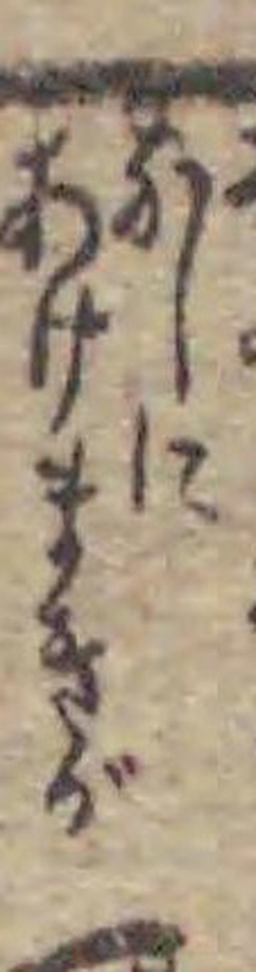あけまきが
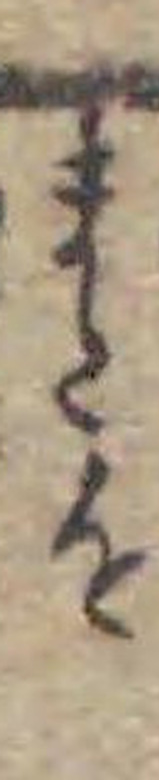またを
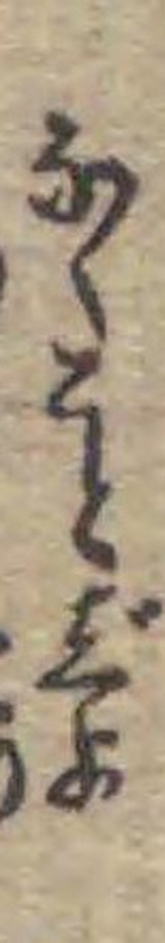なくことじよ
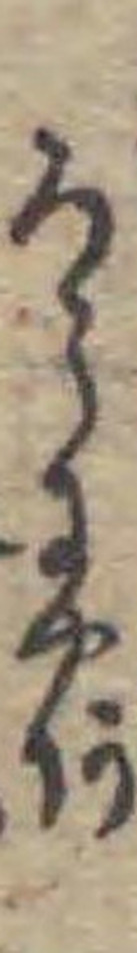ろうにや何
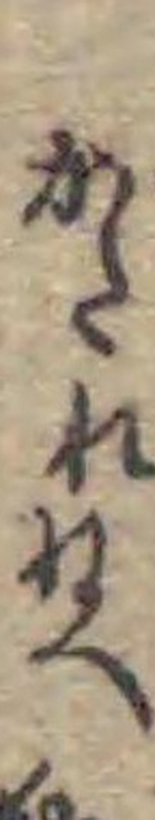かたれねへ
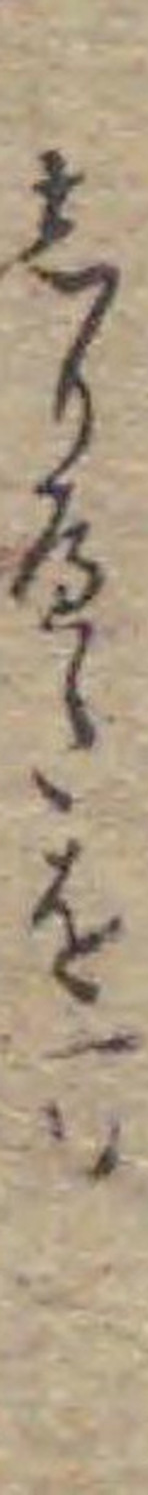しりへたを一寸
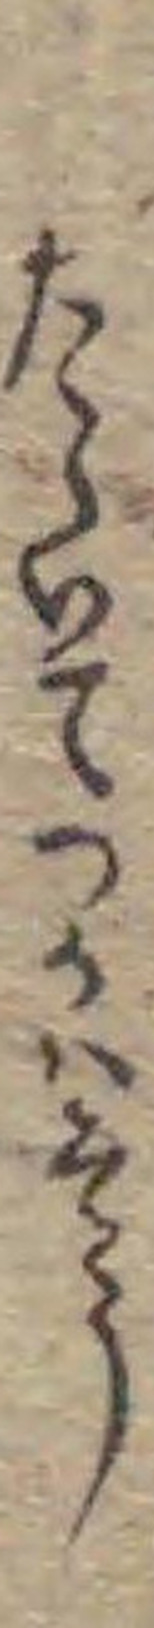たゝいてつかはそう
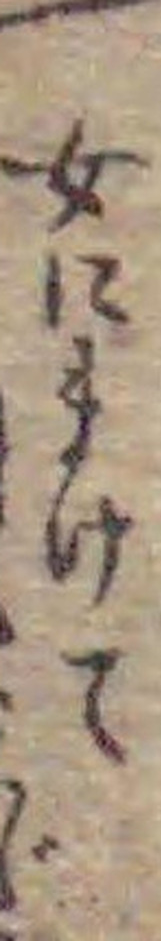女にまけて
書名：江戸花俳優贔屓 : 3巻
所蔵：国立国会図書館 National Diet Library, JAPAN
